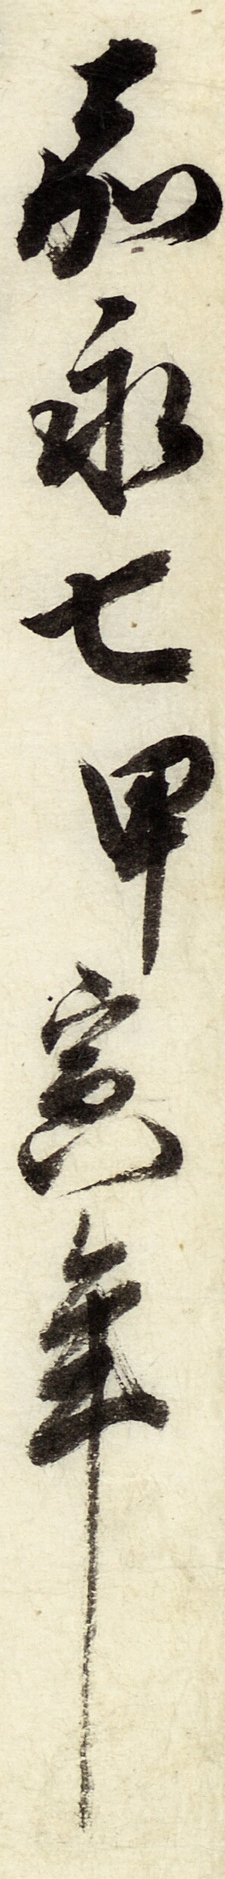嘉永七甲寅年
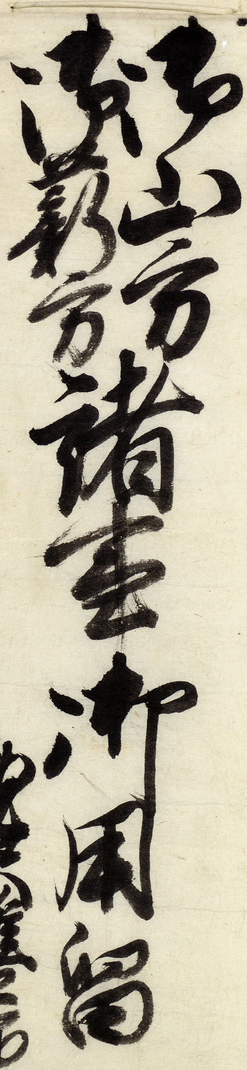御薪方諸事御用留
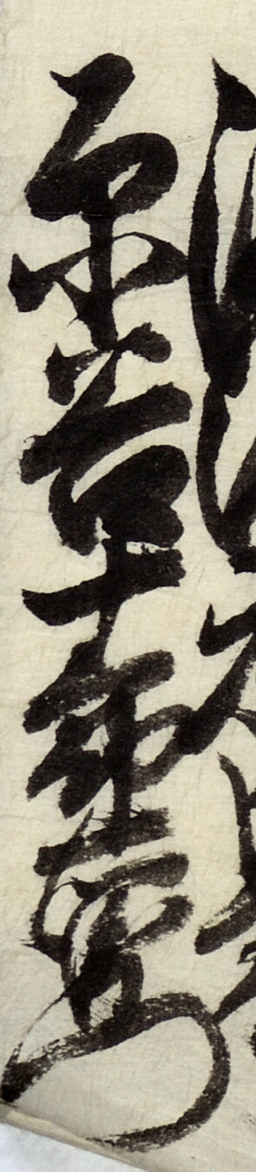原谷十郎右衞門
